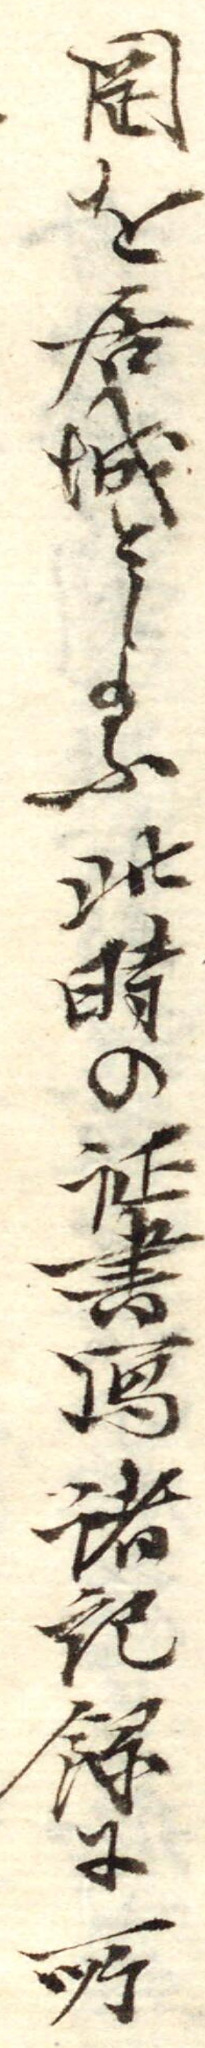岡を居城としゐふ此時の証書写諸記録尓所
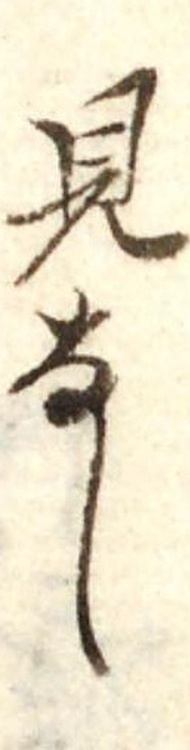見なし
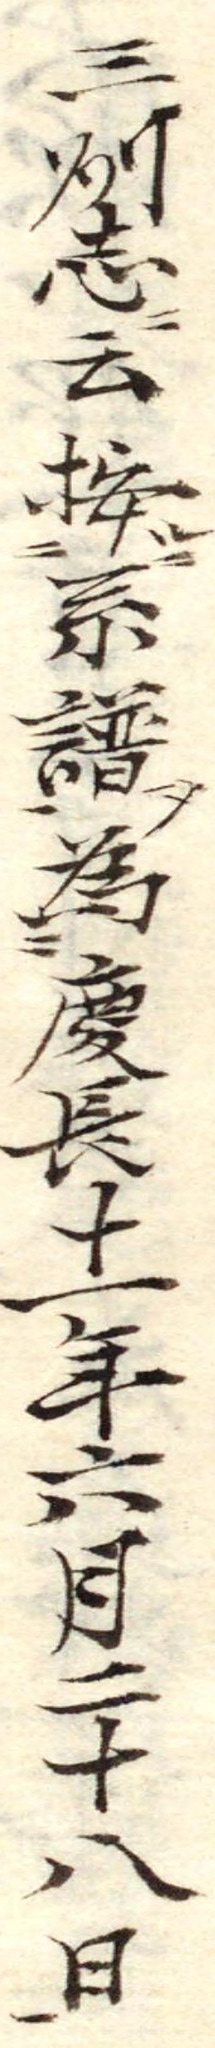三州志に云按るに系譜を為慶長十一年六月二十八日
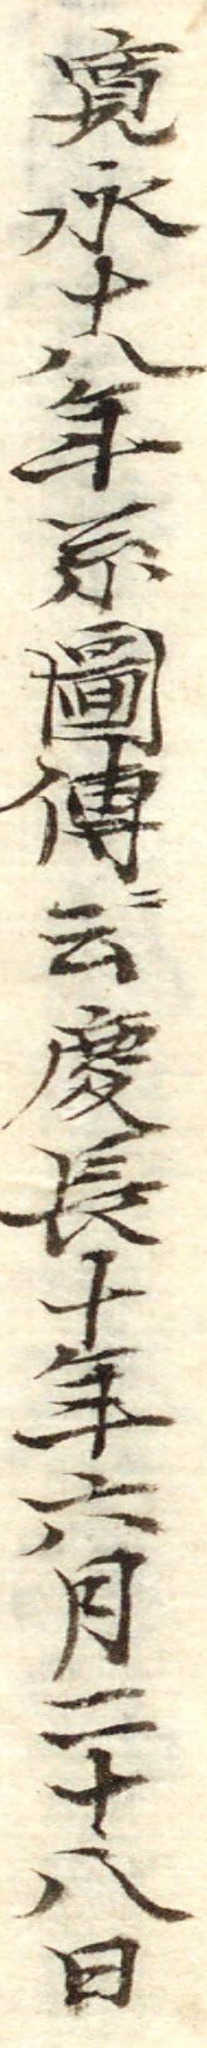寛永十八年系図傳に云慶長十年六月二十八日
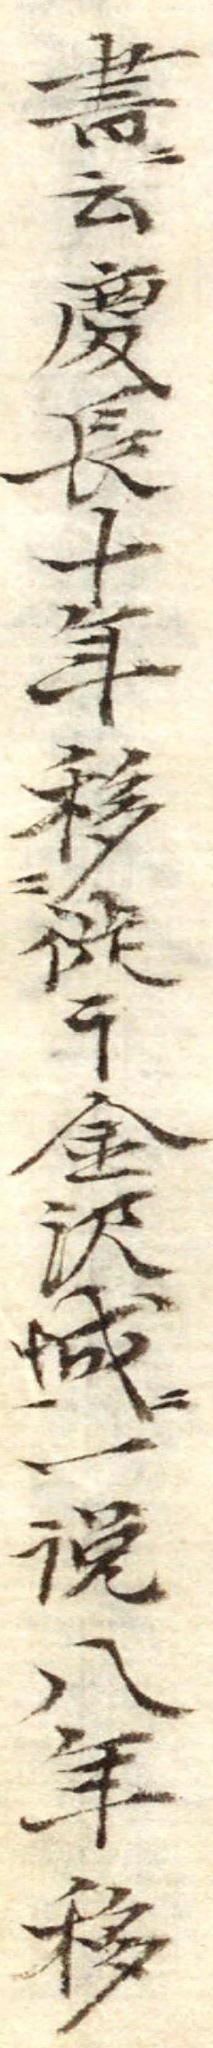書に云慶長十年移従干金沢城に一説八年移

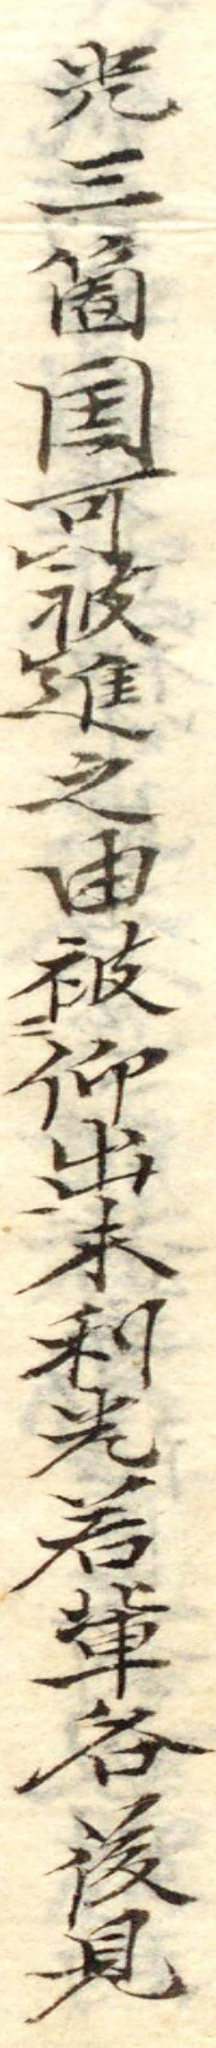光三箇国可被進之由被仰出未利光若輩各後見
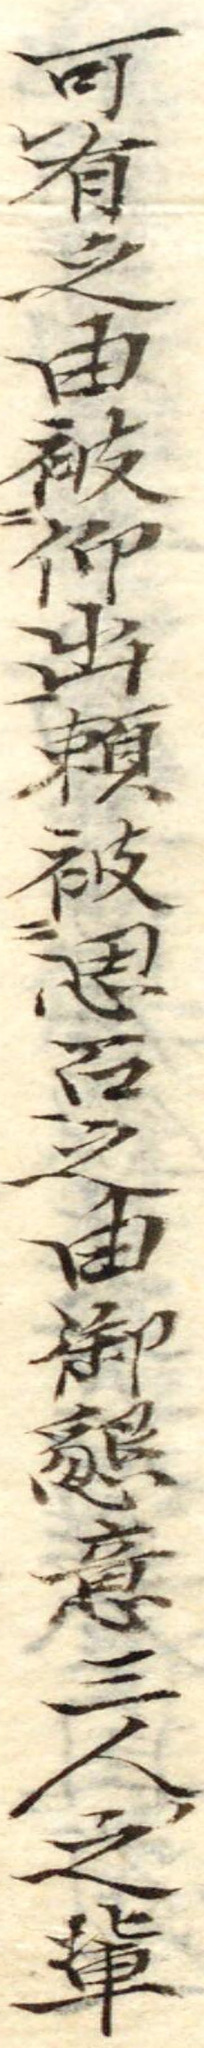可有之由被仰出頼被思召之由御懇意三人之輩
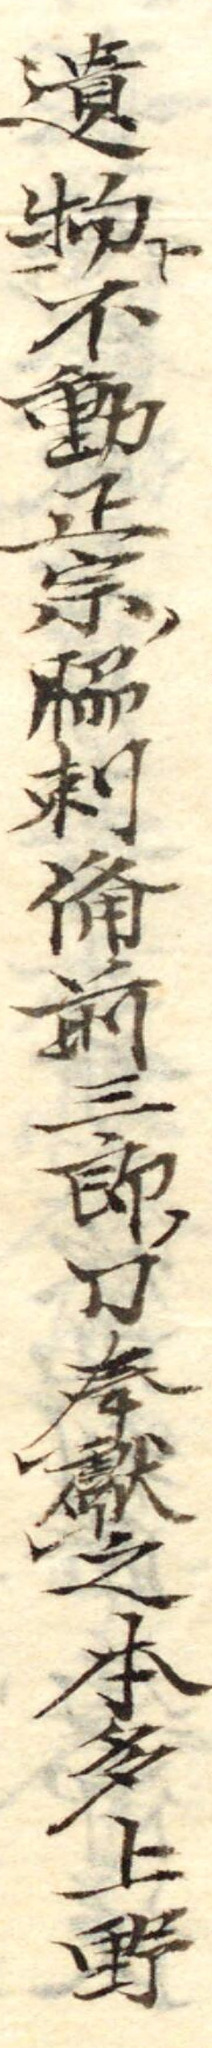遺物と不動正宗の脇刺備前三郎の刀奉獻之本多上野
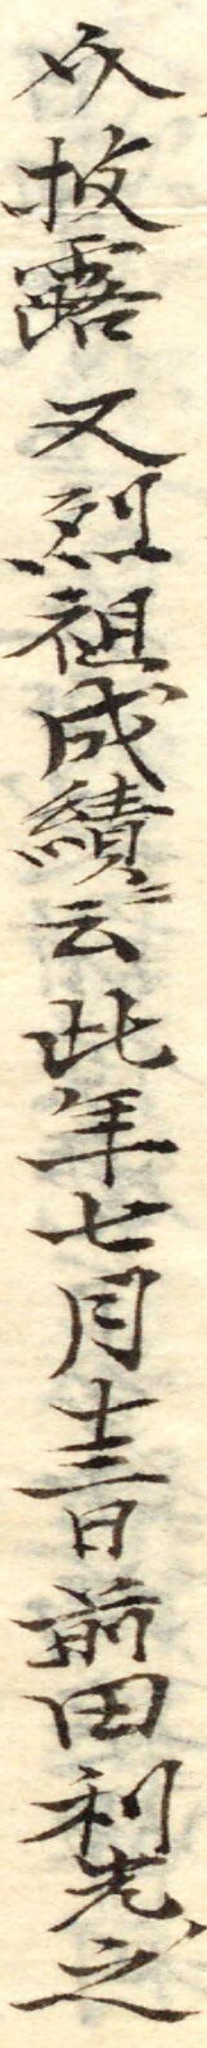介披露又烈祖成績に云此年七月十三日前田利光之
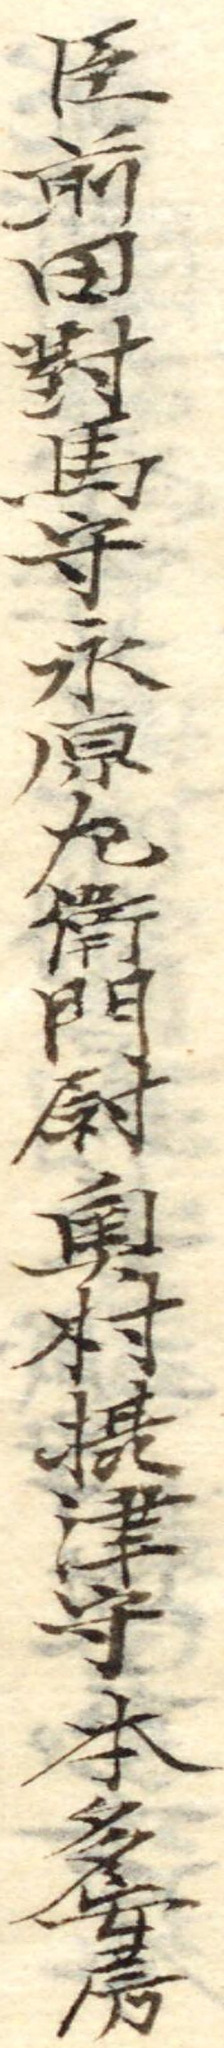臣前田対馬守永原左衛門尉奥村摂津守本多安房
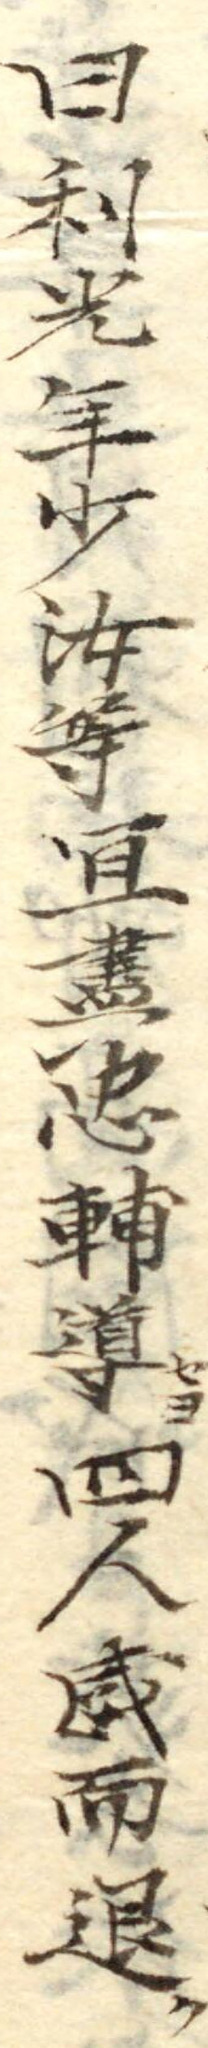曰利光年少汝等冝盡忠輔導せよ四人感而退く
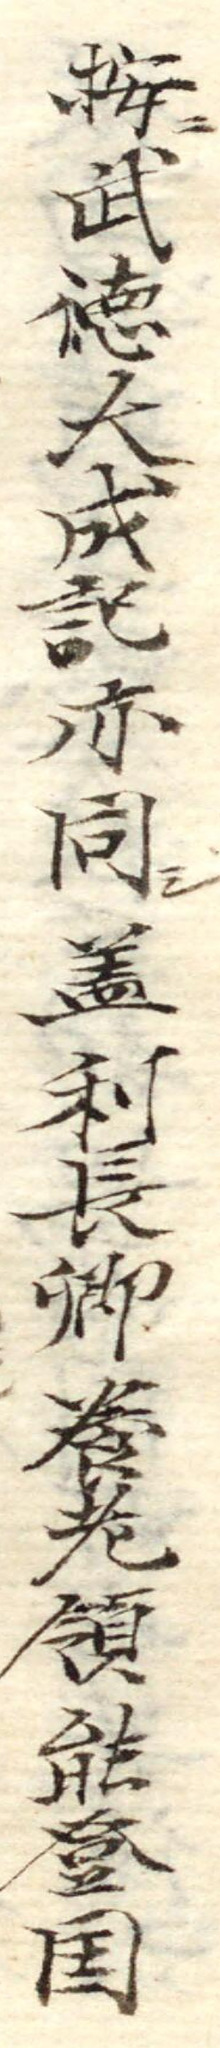按に武徳大成記亦同し蓋利長卿養老領能登国
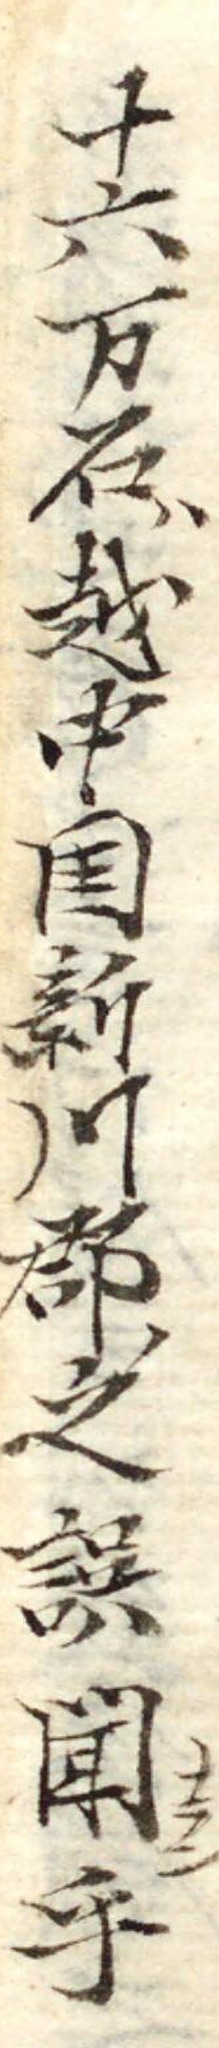十六万石は越中国新川郡之誤聞ならん乎
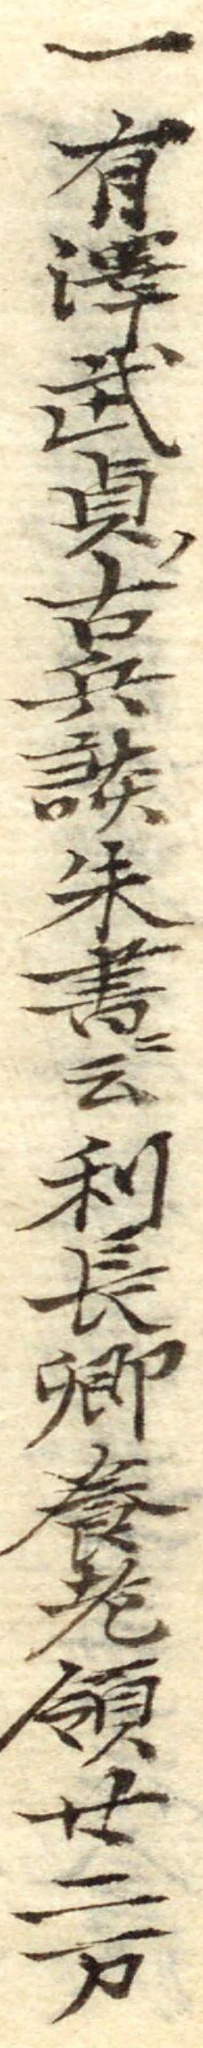一有沢武貞の古兵談朱書に云利長卿養老領廿二万
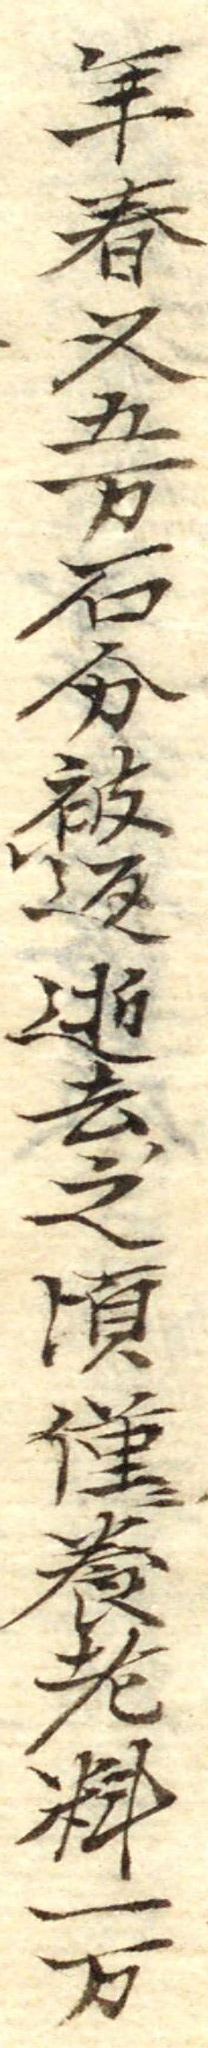年春又五万石分被返逝去之頃僅に養老料一万
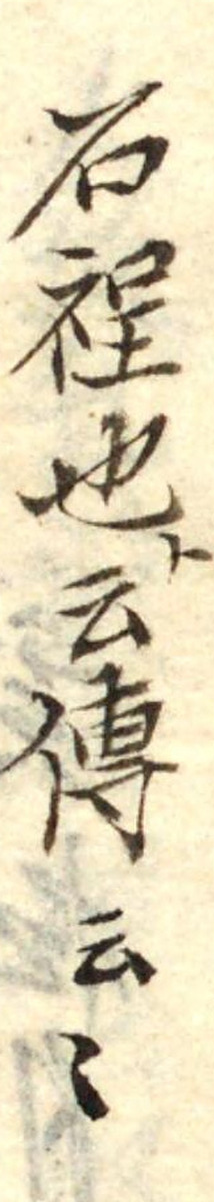石程也と云傳云々
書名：前田家封国証書集録
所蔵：Ishikawa Prefectural Library
